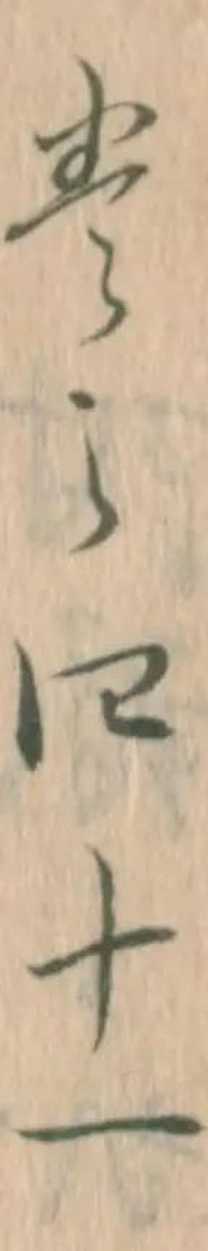巻之四十一
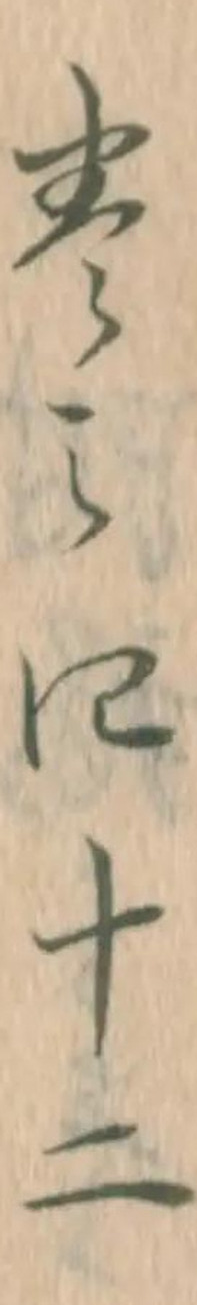巻之四十二
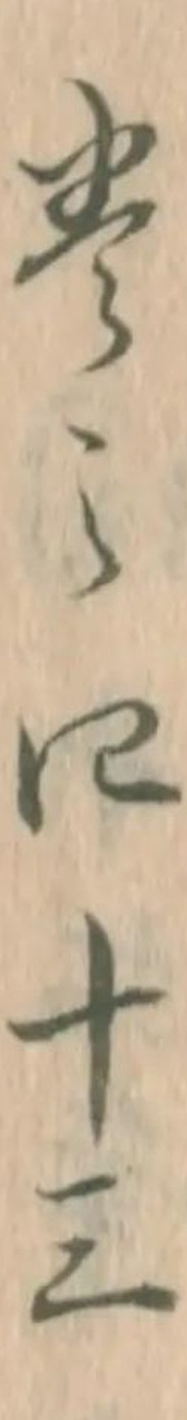巻之四十三
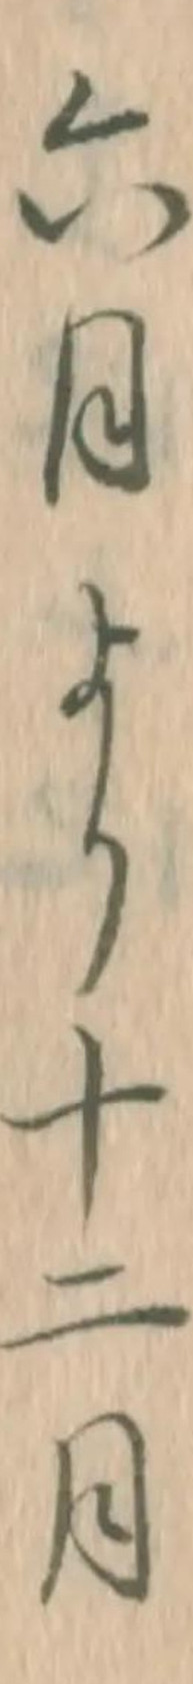六月より十二月

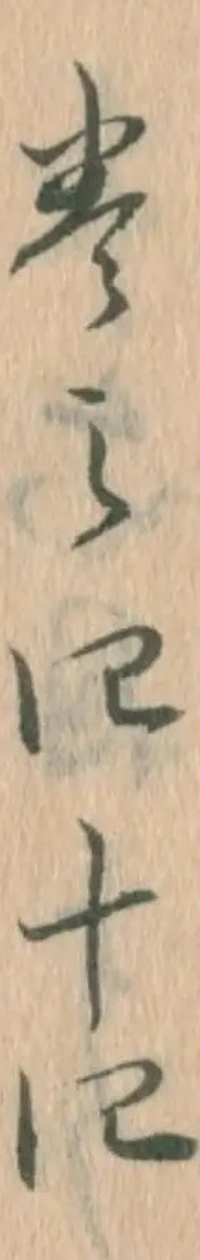巻之四十四
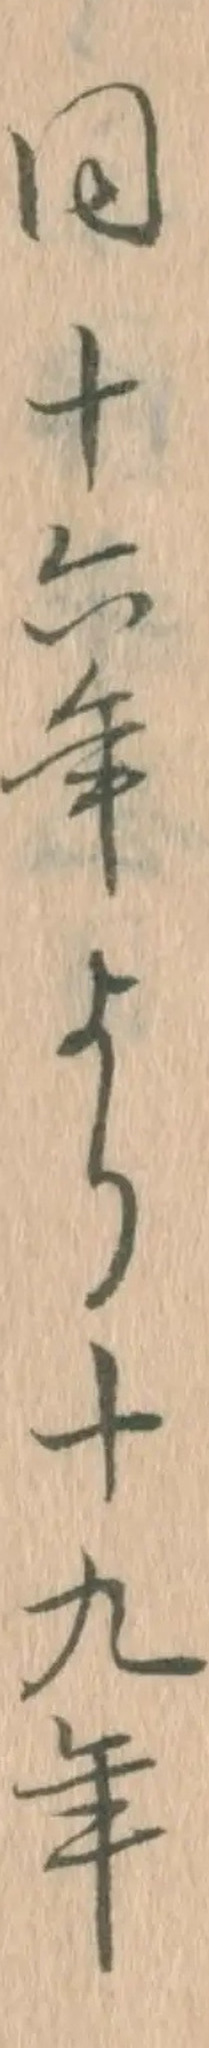同十六年より十九年
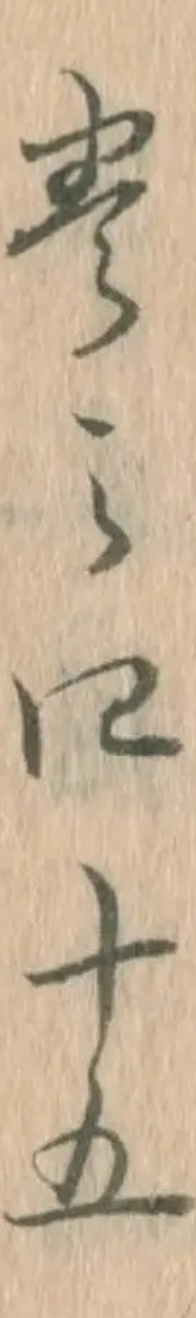巻之四十五
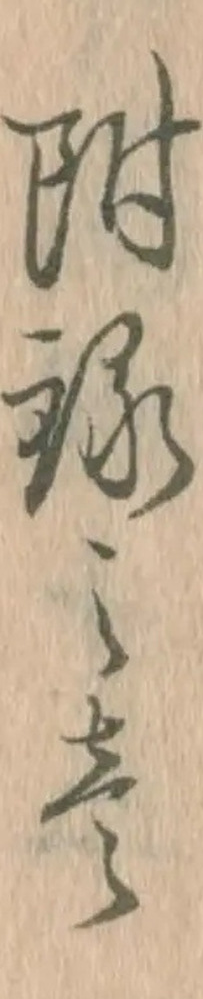附録之壱
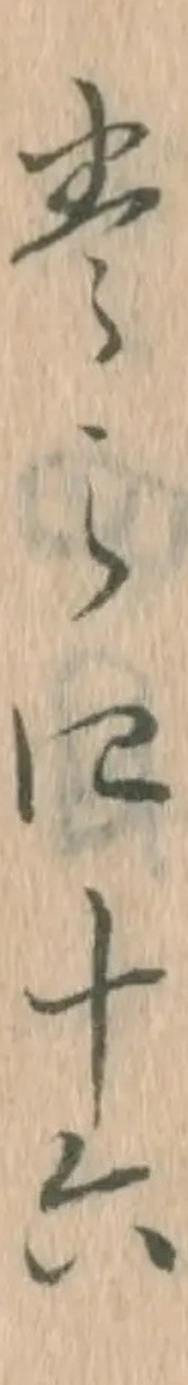巻之四十六
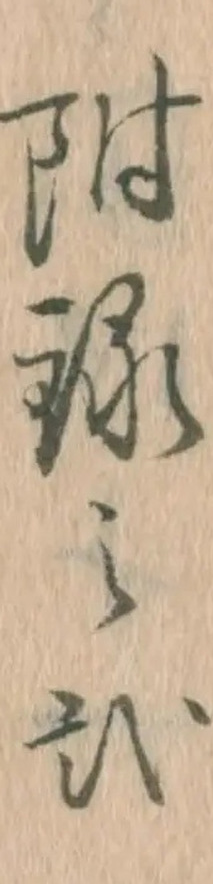附録之壱
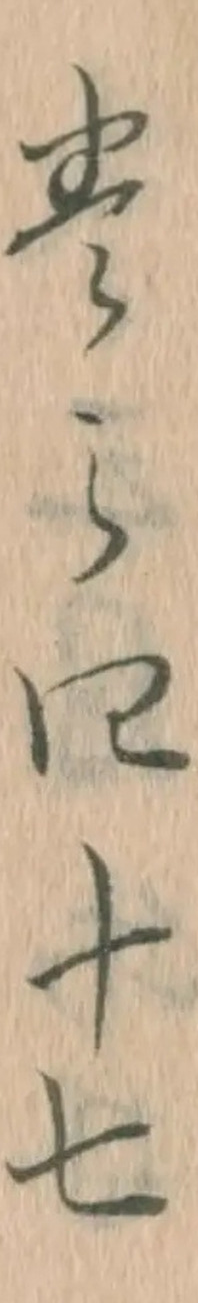巻之四十七
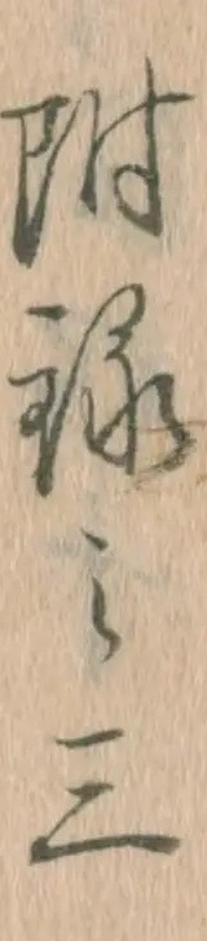附録之三
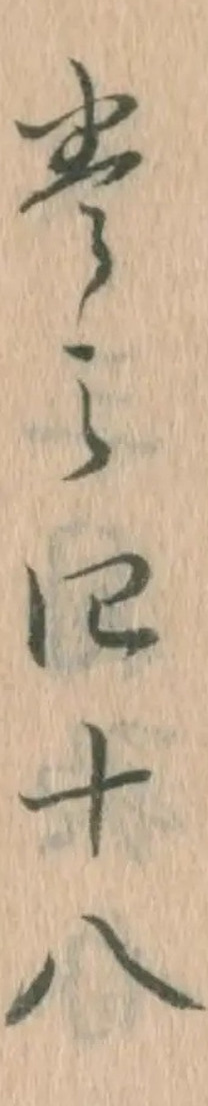巻之四十八
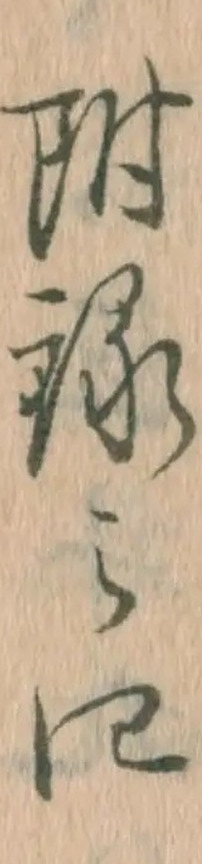附録之四
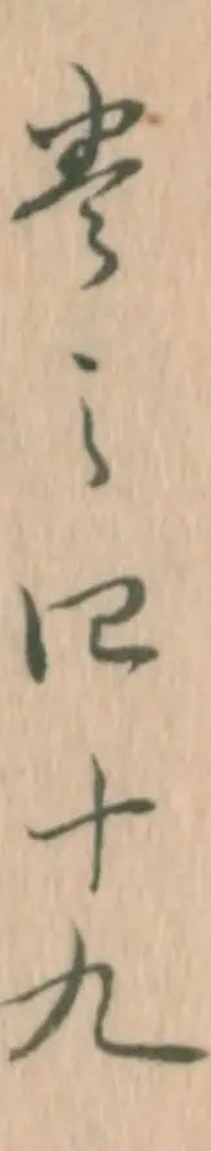巻之四十九
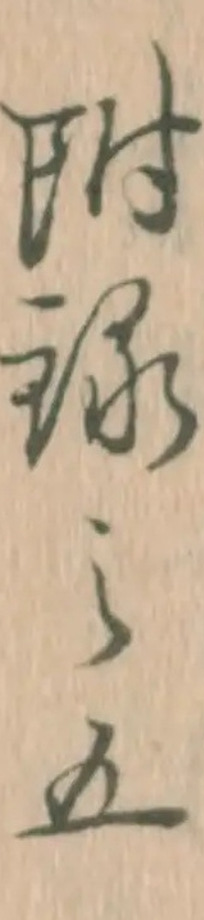附録之五
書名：切支丹御退治記 49巻. [1]
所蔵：国立国会図書館 National Diet Library, JAPAN
